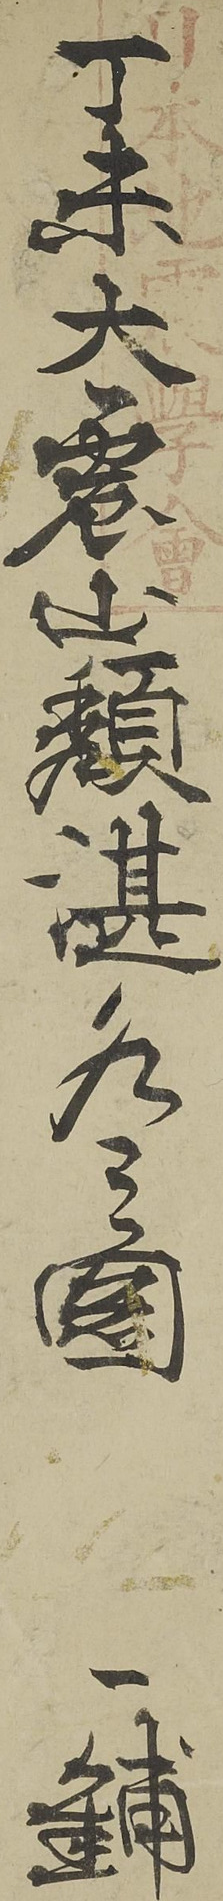丁未大震山頽湛水之圖一鋪

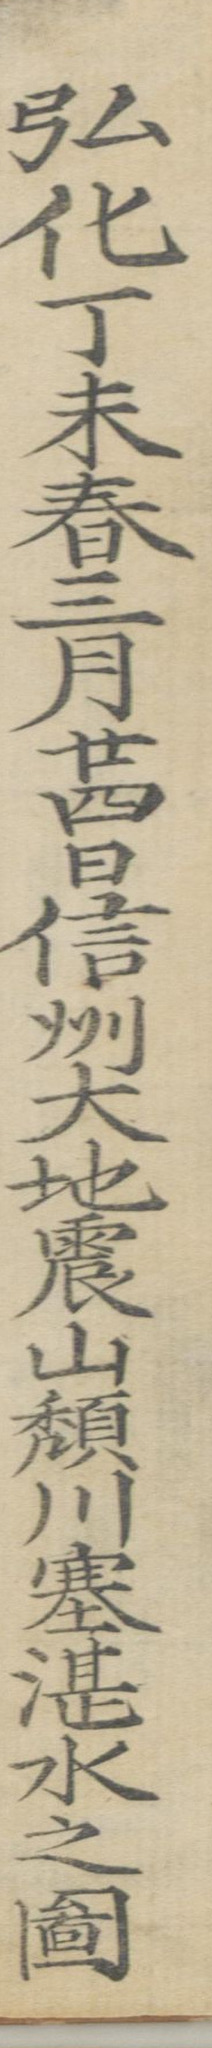弘化丁未春三月廿四日信州大地震山頽川塞湛水之圖
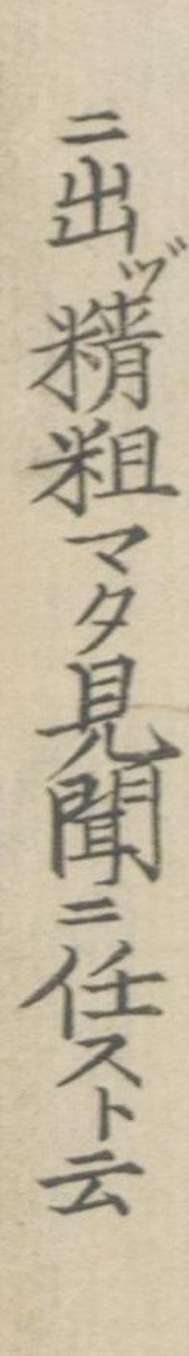二出ヅ精粗マタ見聞二任ㇲト云
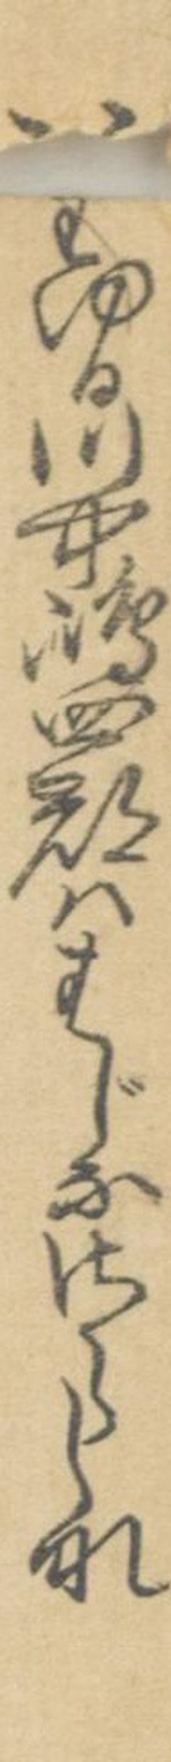いはゆる川中嶋四郡ハはじなさらしな
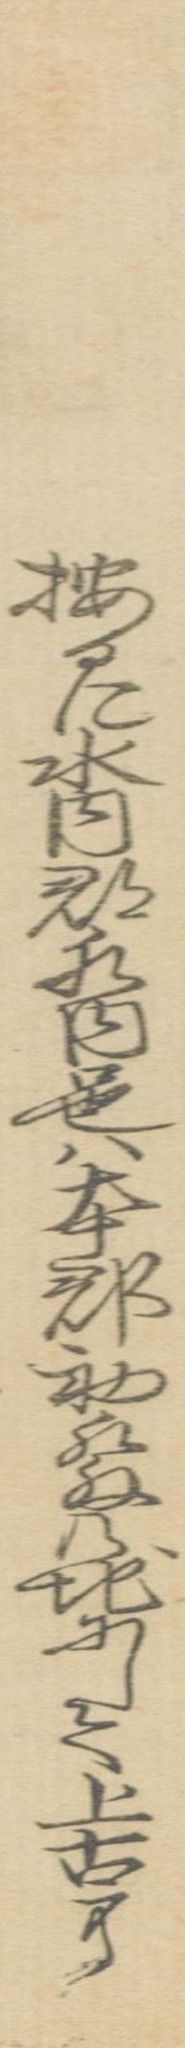按るに水内郡水内邑ハ本郡初発の地にして上古に
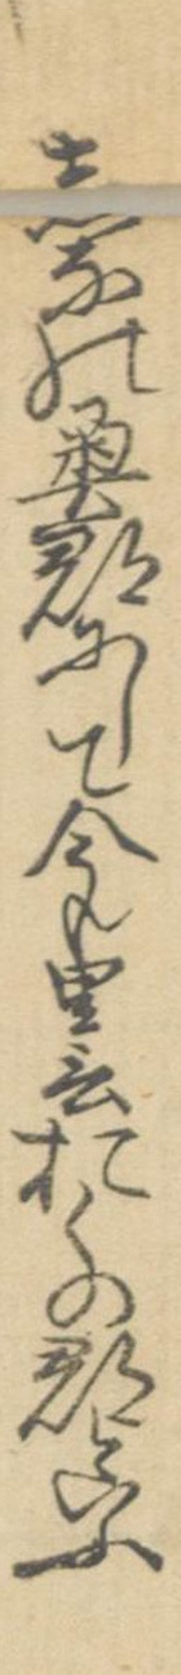しなの奥郡にして今里言おくの郡といふ
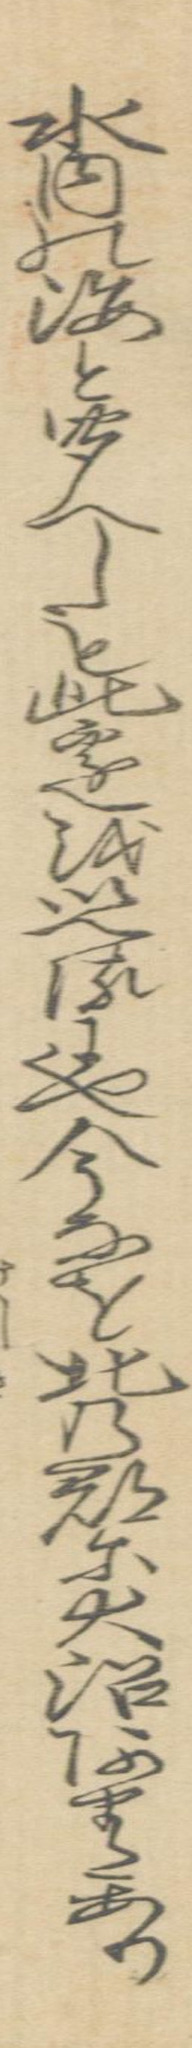水内の海と聞へしも此辺をいへるにや今なを北の郡に大沼あまたあり
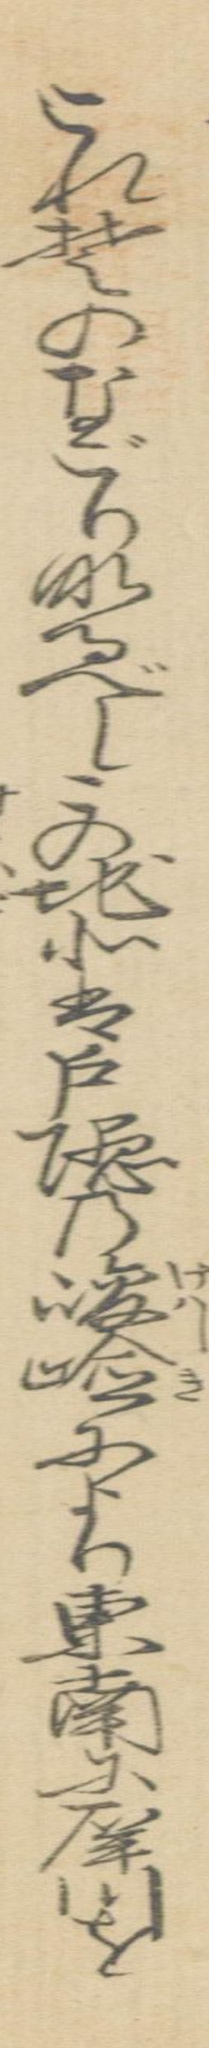これそのなごりなるべしこの地北は戸隠の峻嶮により東南に犀川を
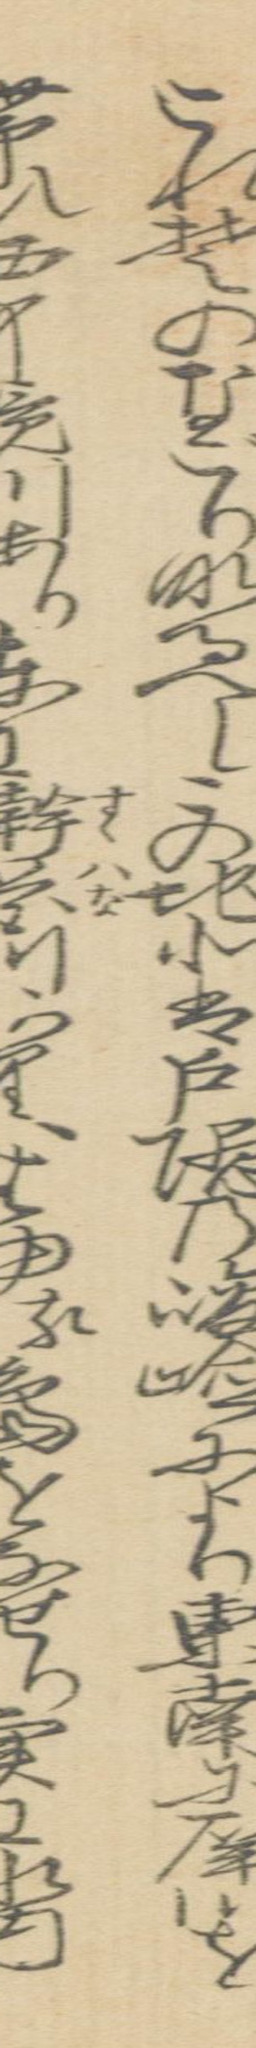帯ひ西に境川あり東に澣花川ありいはゆる嶋をなせり実二水内
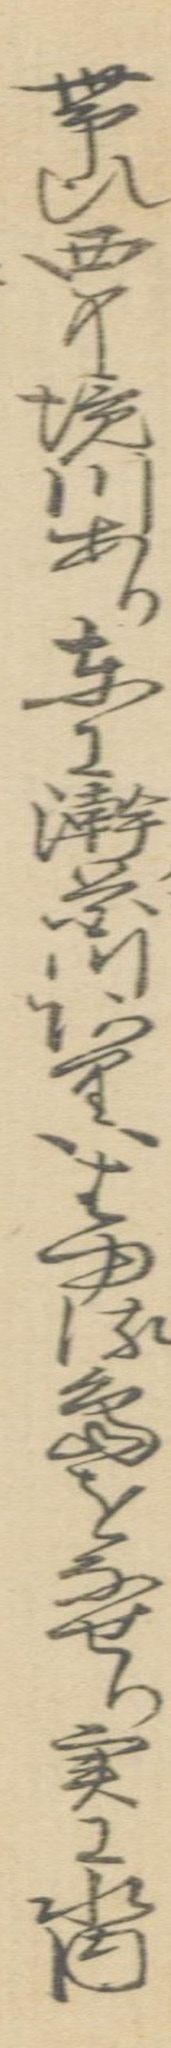帯ひ西に境川あり東に澣花川ありいはゆる嶋をなせり実二水内
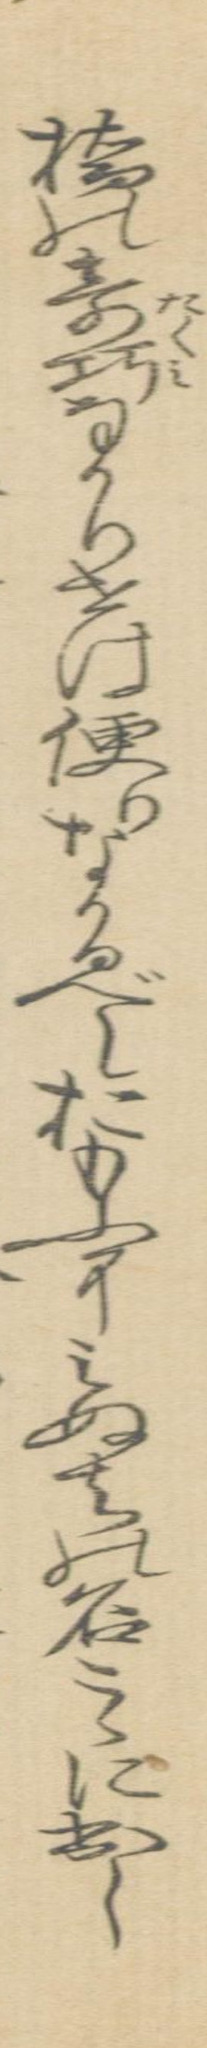橋の奇巧なかりせは便りなりなかるべしおもふにミぬちの名こゝに出し
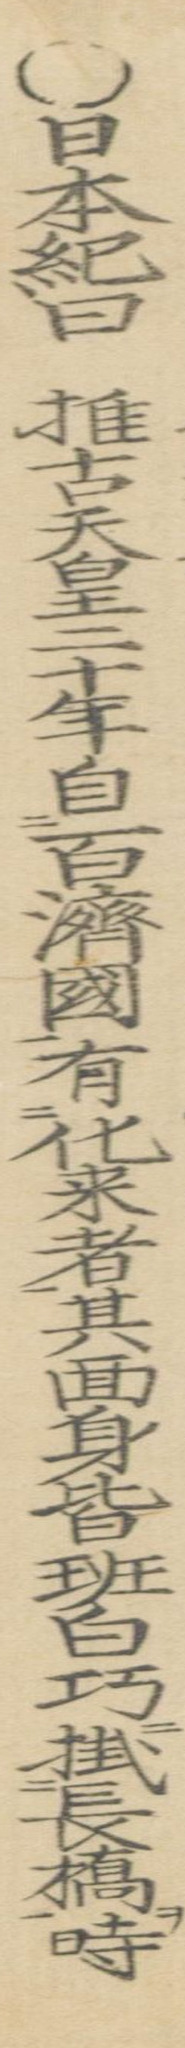◯日本紀二曰推古天皇二十年自百済国有化來者其面身皆班白巧二掛長橋ヲ時
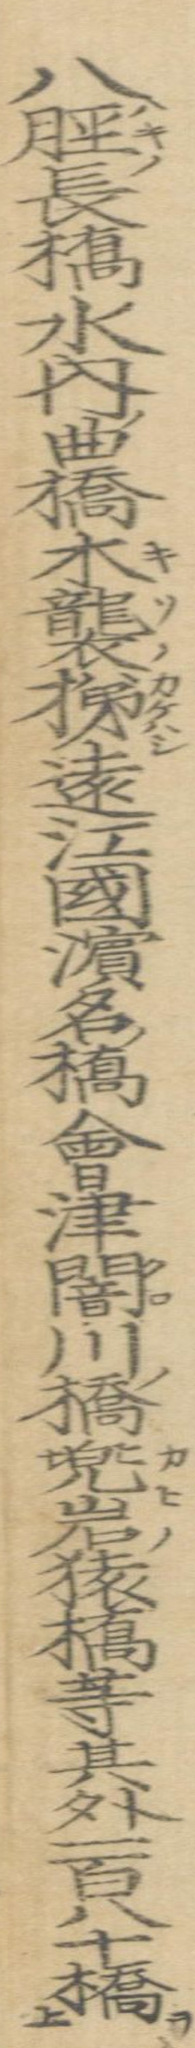八脛長橋水内ノ曲橋木襲梯遠江国浜名橋会津闇川ノ橋兜岩ノ猿橋等其外一百八十橋ヲ
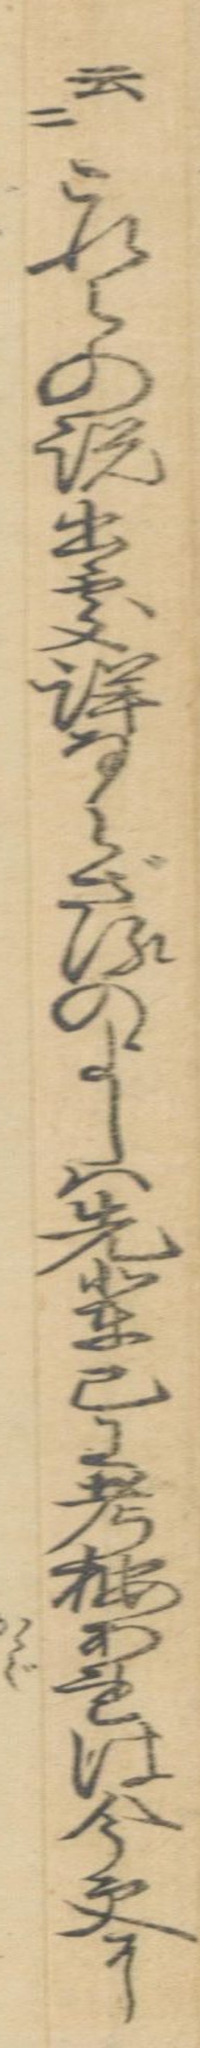云これらの説出処詳ならざるのよしハ輩已に考按あれば今更に
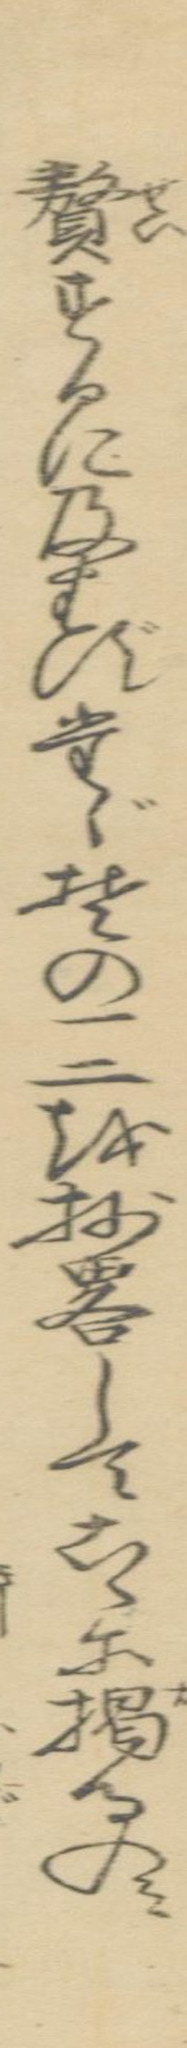贅するに及ばずたゞその一二を抄略してこゝに掲るのミ
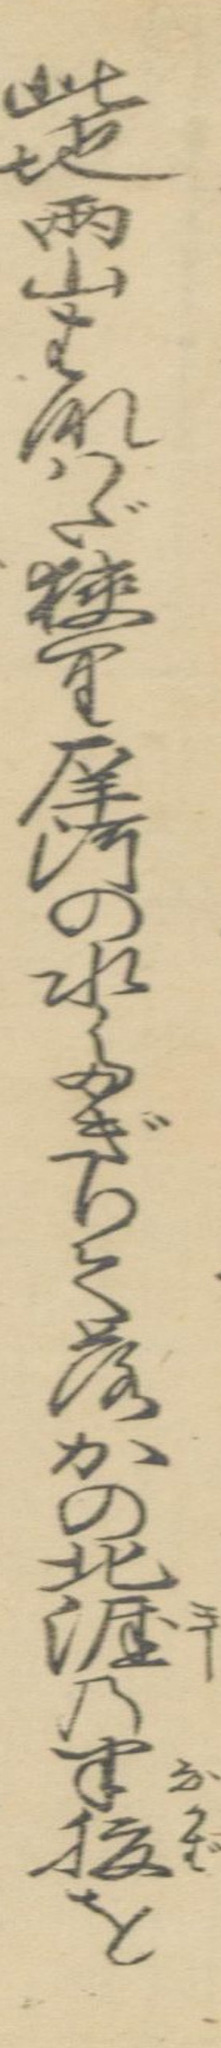此地両山はなはだ狭り犀河の水たぎりて落かの北涯の半腹を
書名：丁未大震山頽湛水之圖　一鋪
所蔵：東京大学地震研究所図書室 Earthquake Research Institute Library, The University of Tokyo, JAPAN
